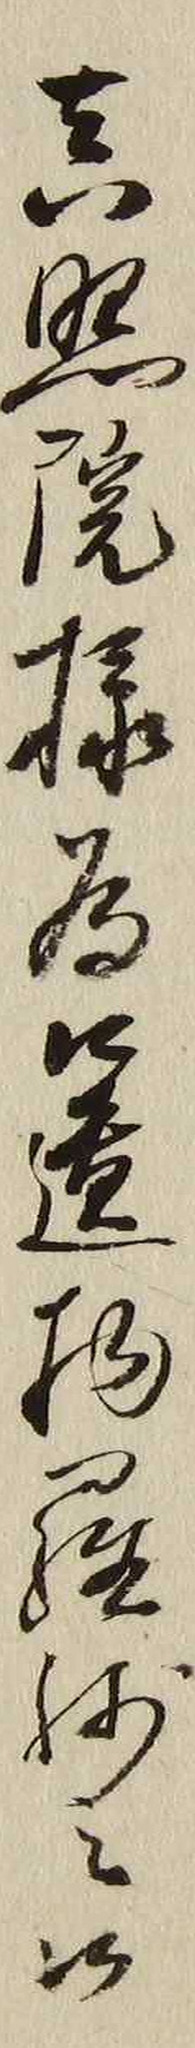真照院様為御遣物羅紗之御
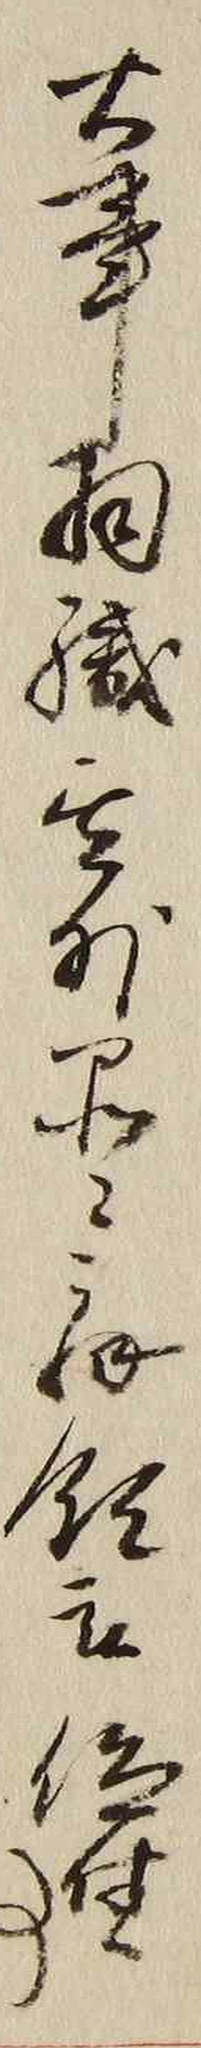大事羽織其外品々拝領被仰付候事
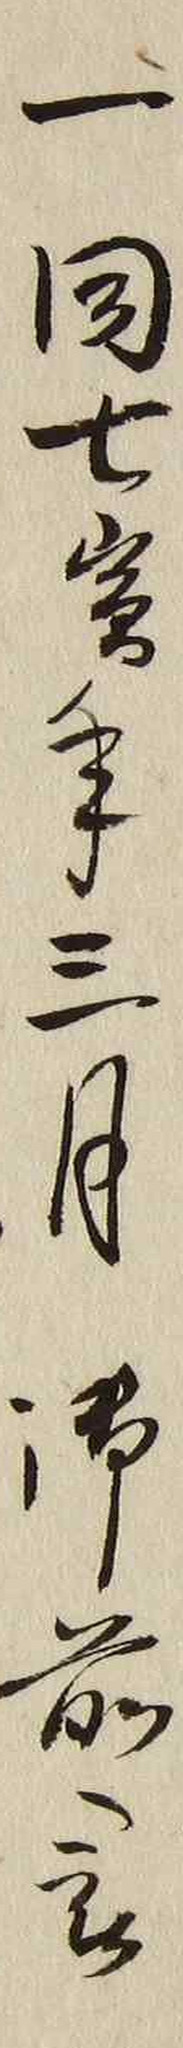一同七寅年三月御前へ被
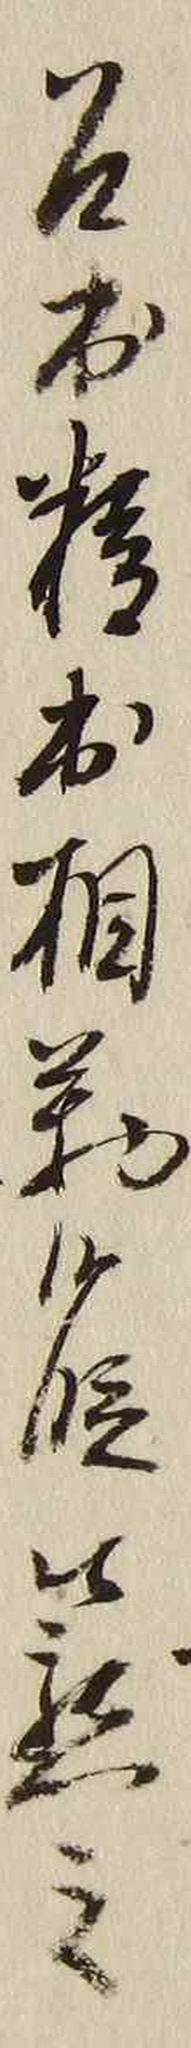召出精出相勤候段御懇之
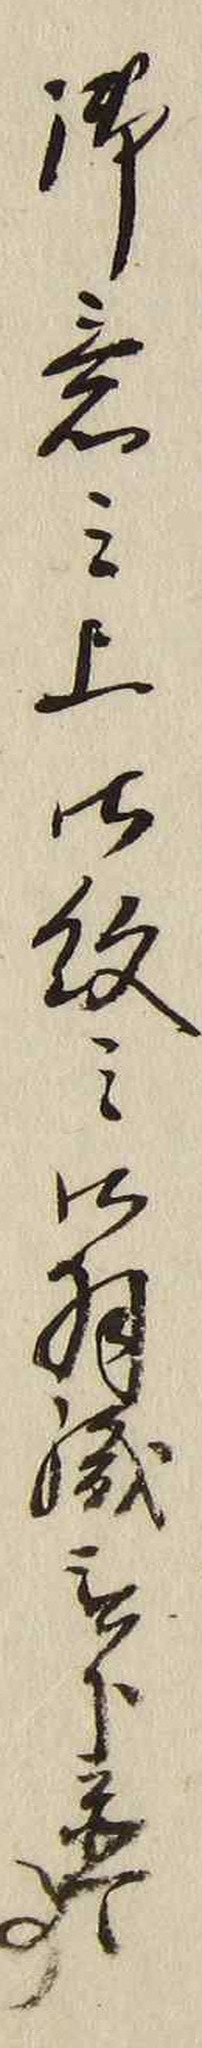御意之上御紋之御羽織被下置候事

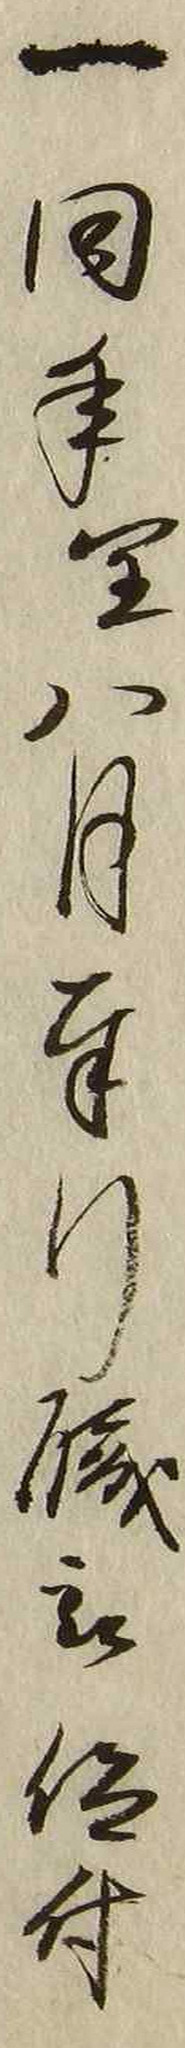一同年閏八月奉行職被位付
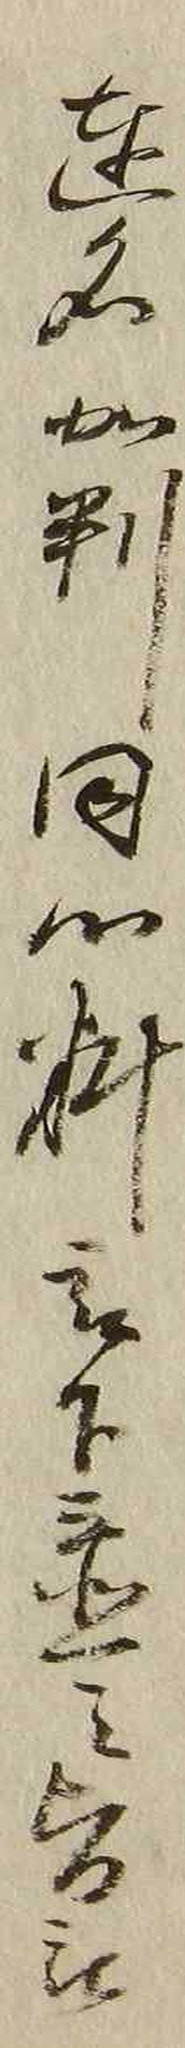連名加判同心料被下置之旨被
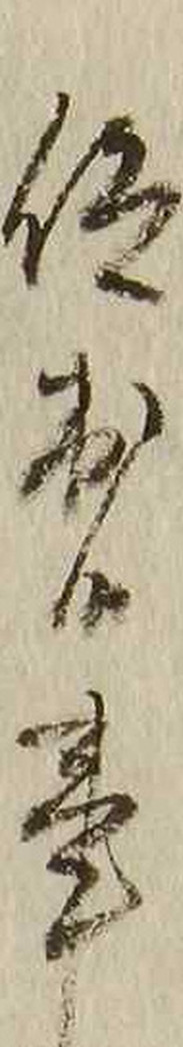仰出候事
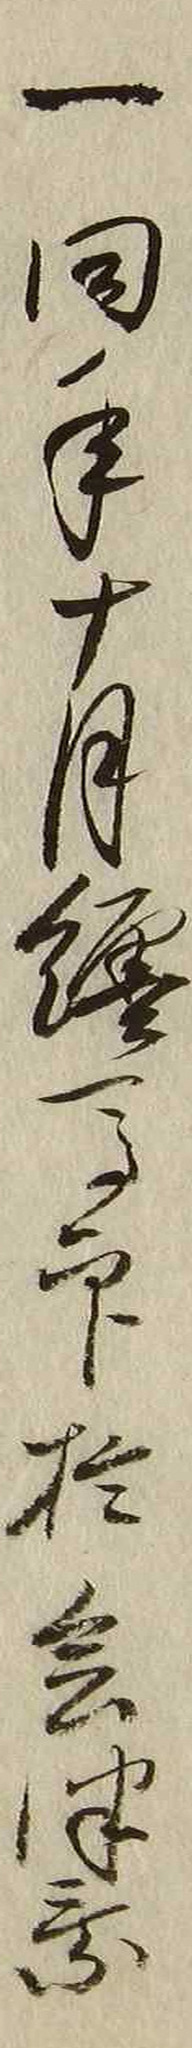一同年十月纏馬印於会津乗
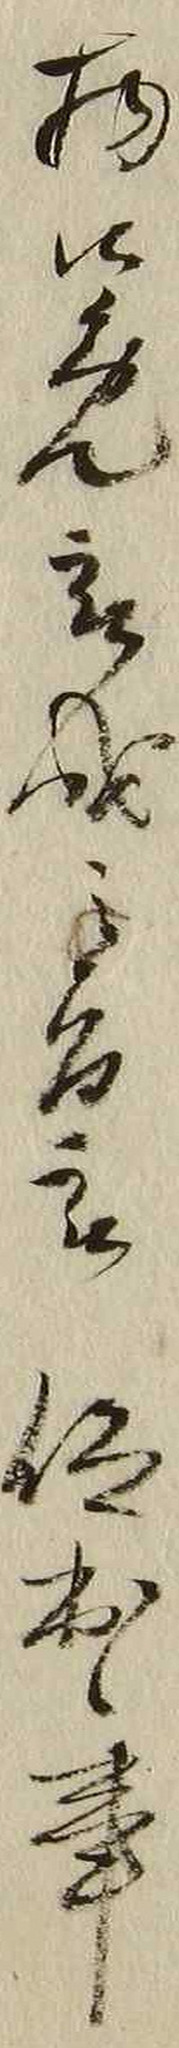物御免被成之旨被仰出候事
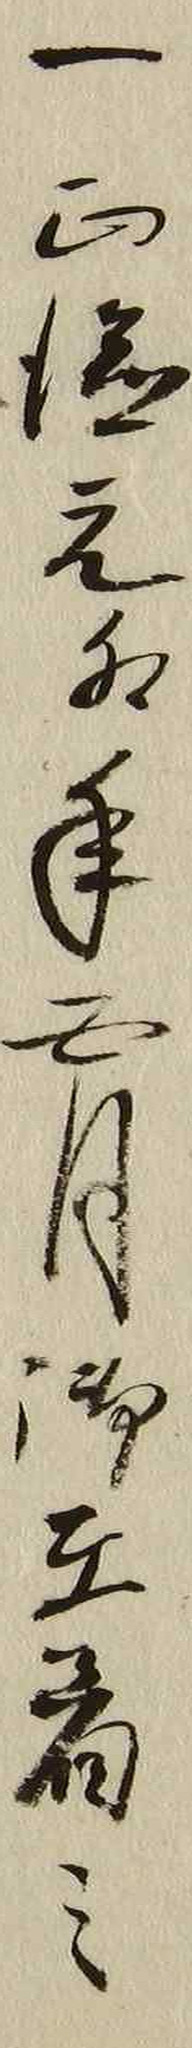一正徳元卯年正月御在着之
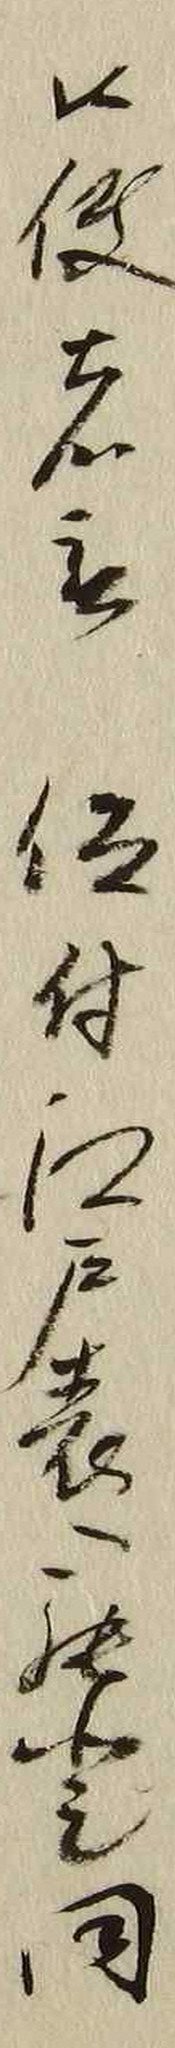御使者被仰付江戸表へ罷登同
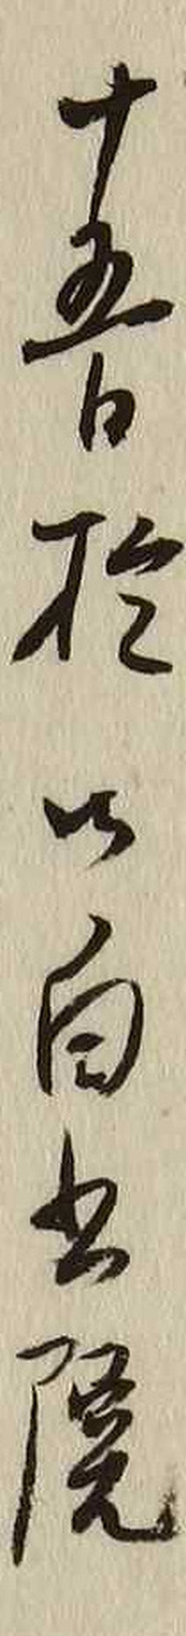十五日於御白書院
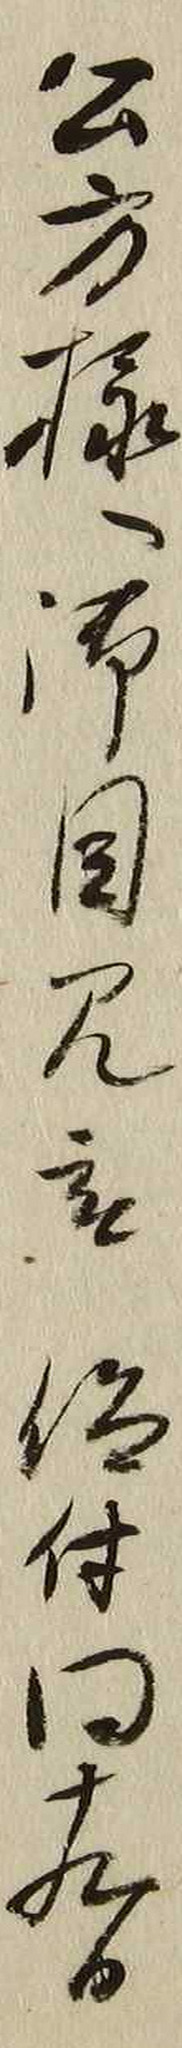公方様へ御目見被仰付同十九日
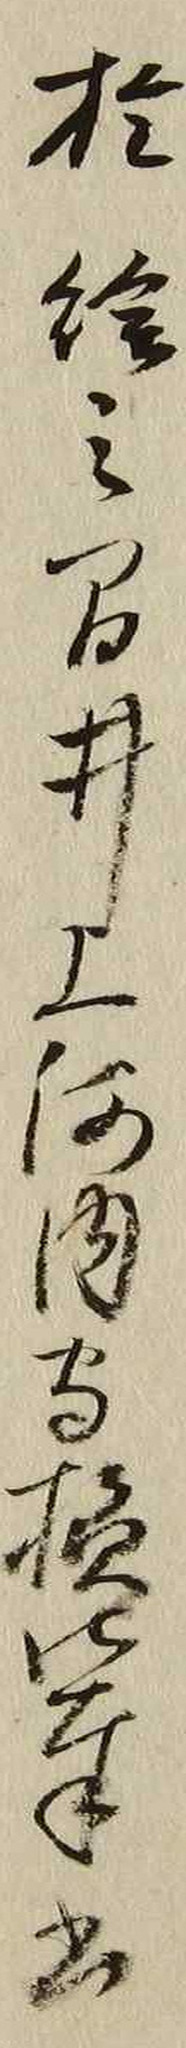於絵之間井上河内守様御奉書
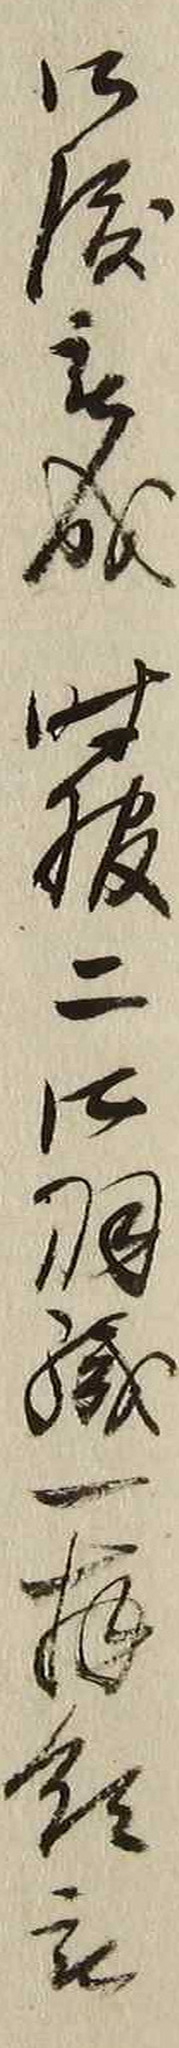御渡被成時服二御羽織一拝領被
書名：諸士系譜　巻之351　す之部1
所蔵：会津若松市立会津図書館
